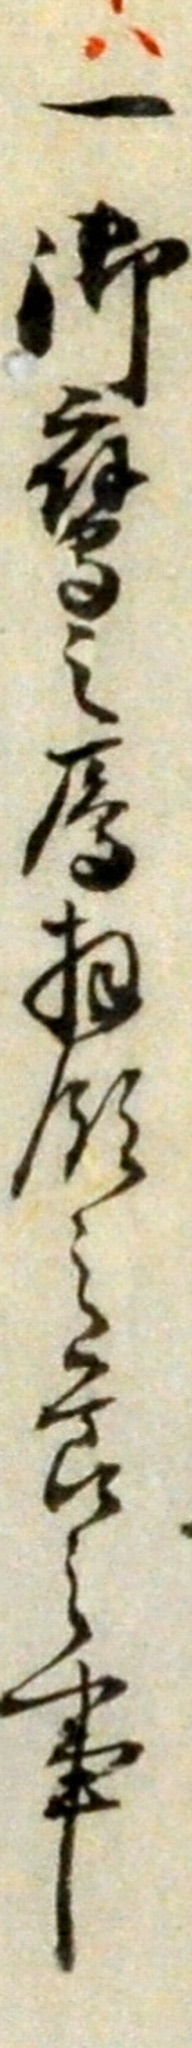一御鷹之雁拝領之節之事
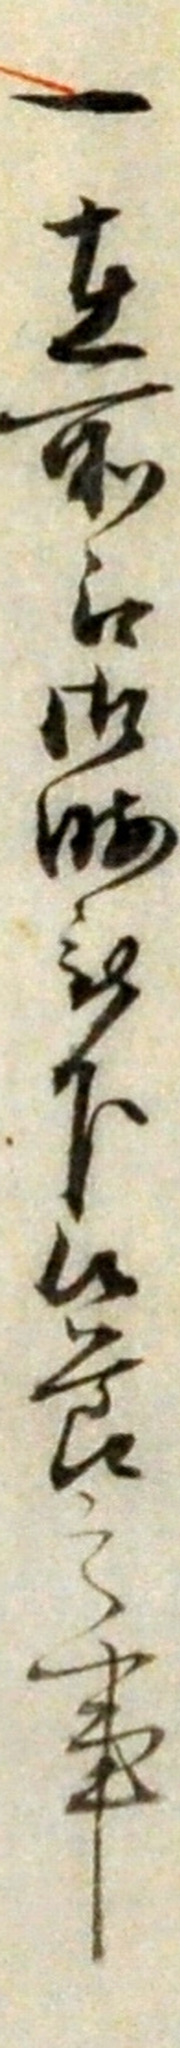一在所え御暇被下候節之事
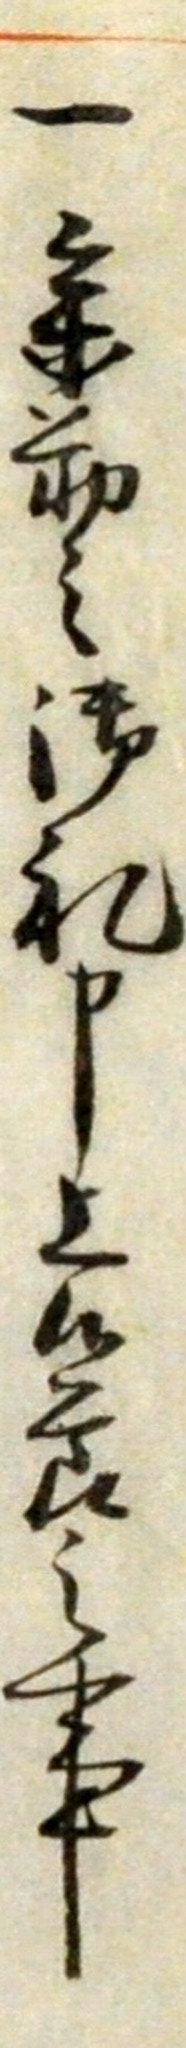一参勤之御礼申上候節之事
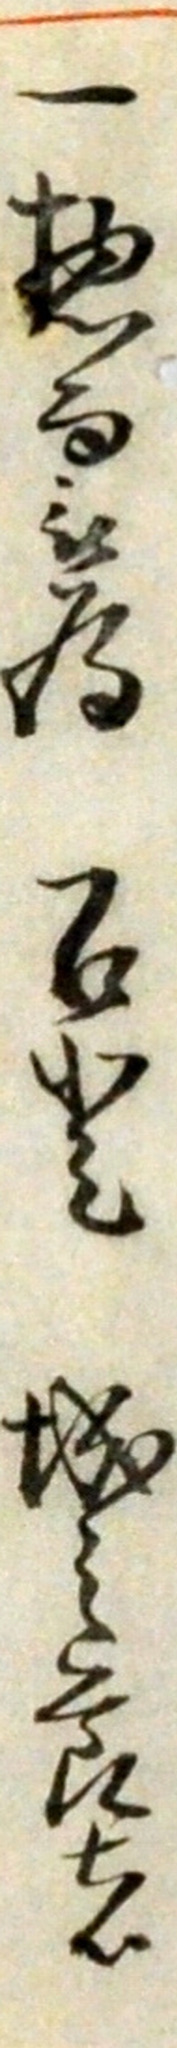一惣て被為召登城之節は
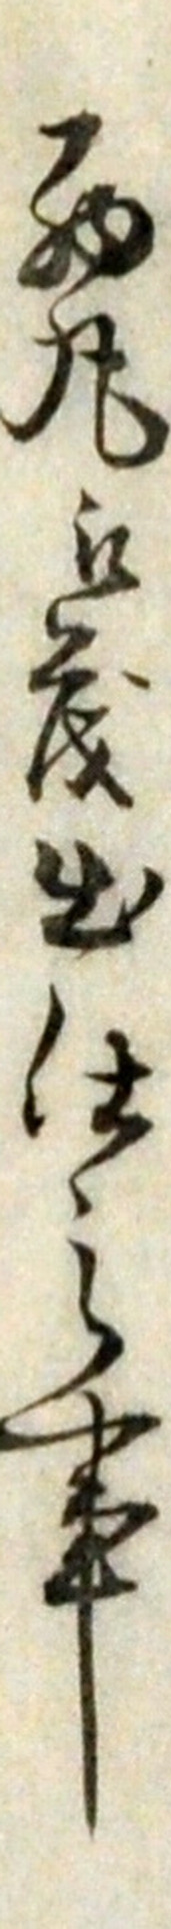西丸えも出仕之事
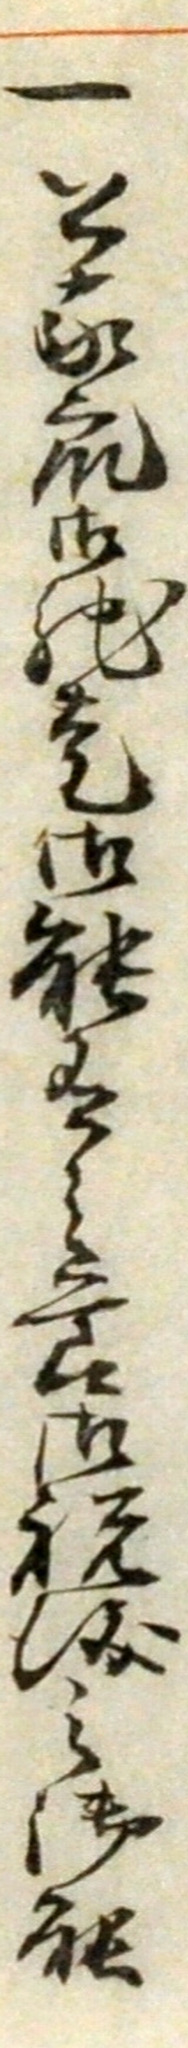一公家衆御馳走御能有之節御祝儀之御能
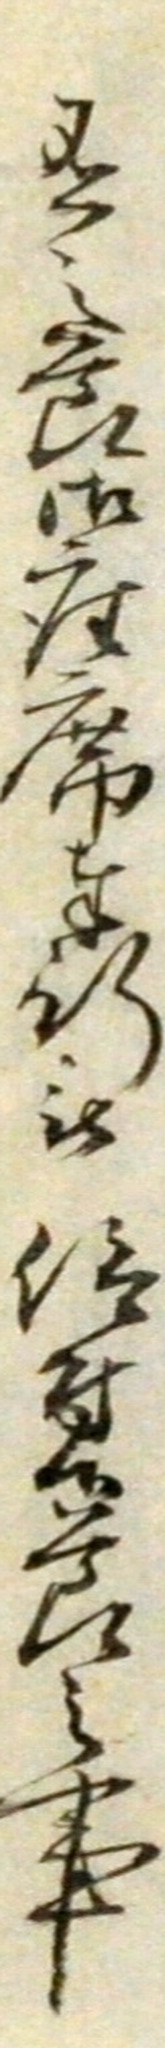有之節御座席奉行被仰付候節之事
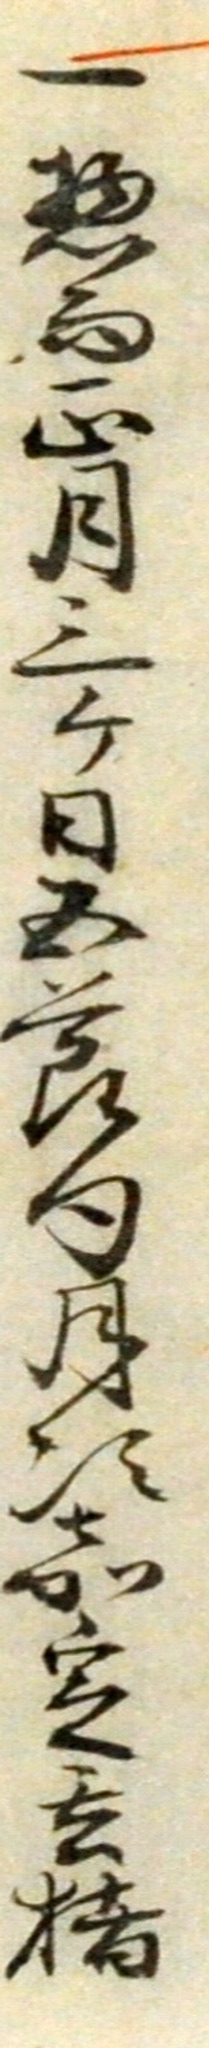一惣て正月三ヶ日五節句月次嘉定玄猪
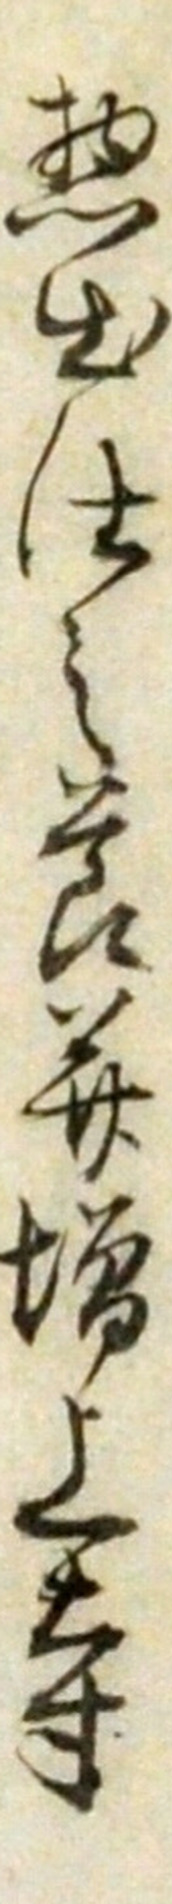惣出仕之節并増上寺
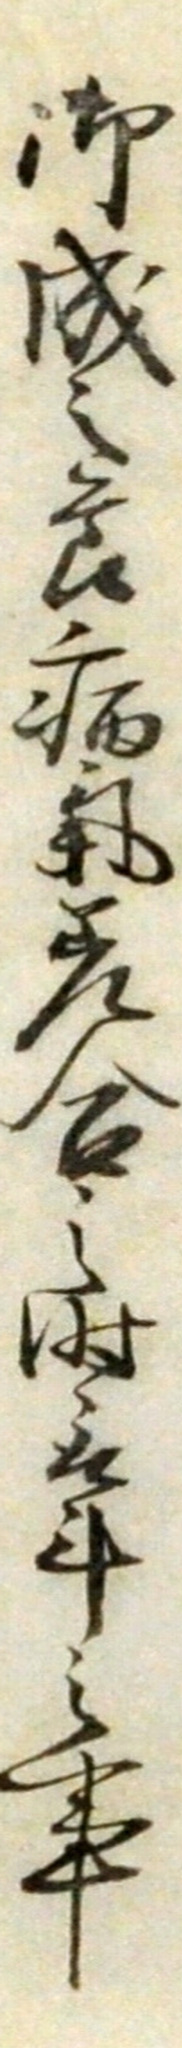御成之節病気差合之時取斗之事

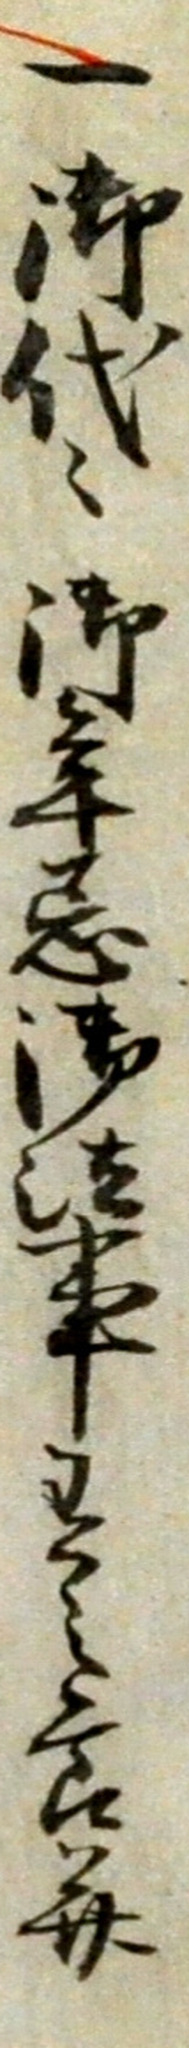一御代々御年忌御法事有之節并
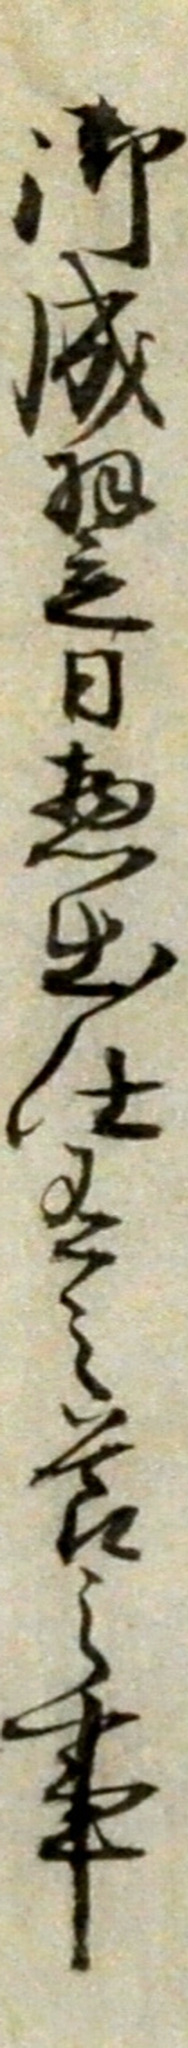御成翌日惣出仕有之節之事
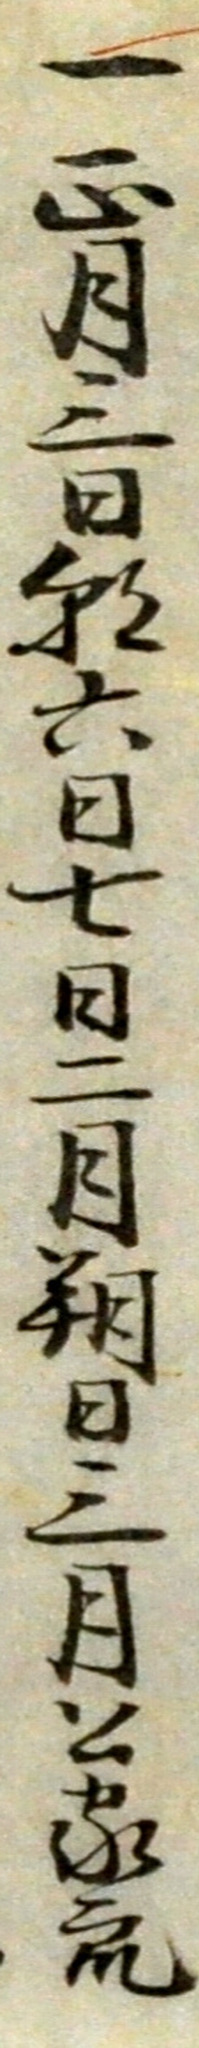一正月三日朝六日七日二月朔日三月公家衆
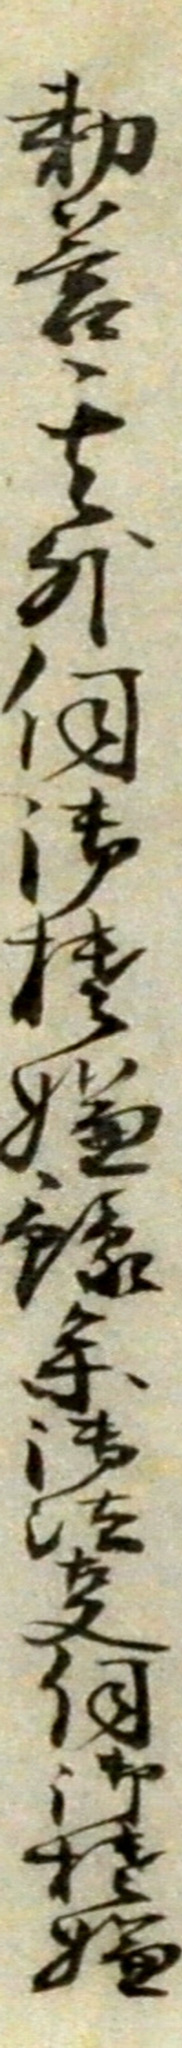勅答其外伺御機嫌予参御法事伺御機嫌
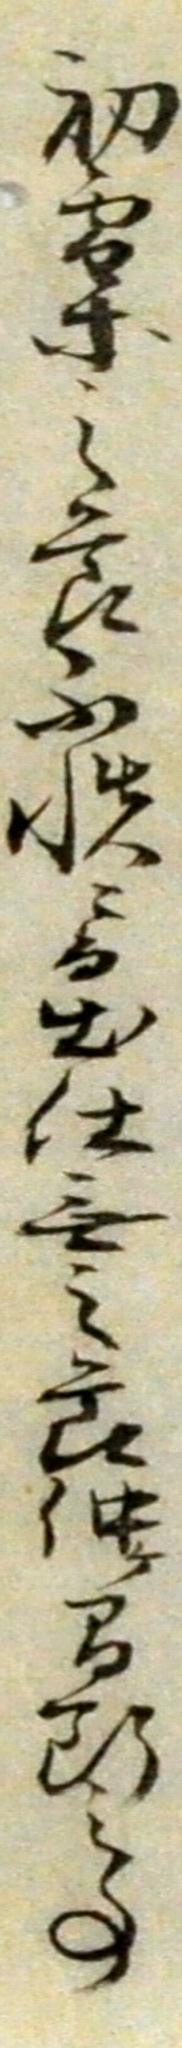初雪等之節不快にて出仕無之節仲ヶ間断之事
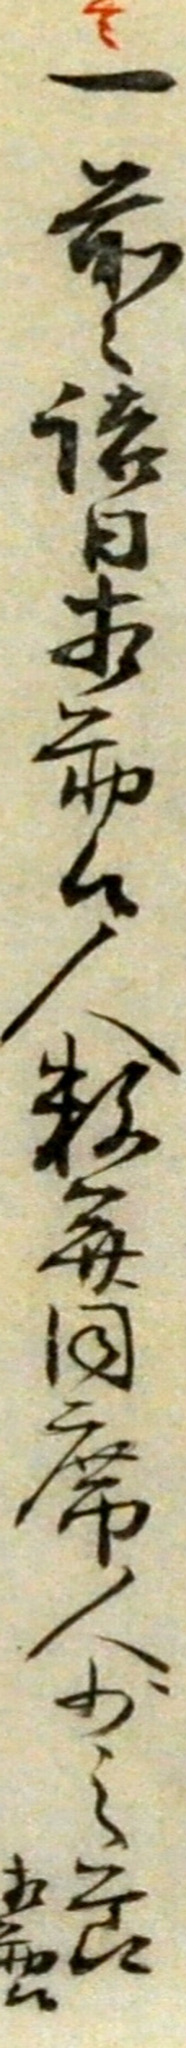一前々詰日相勤候人数并同席人少之節相勤候
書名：申合帳〔一括〕
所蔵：伊那市立高遠町図書館・合同会社AMANE
